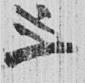之
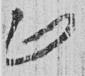㠯（以）
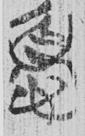憂
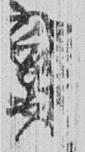○（喪）
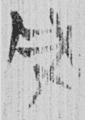凡
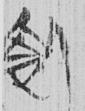飤（食）
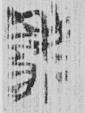○（飲）
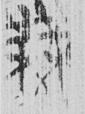無
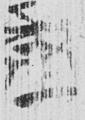量
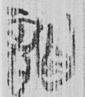○（計）
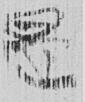是
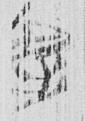{胃刀}（謂）
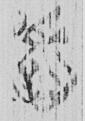滔
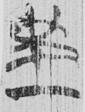皇
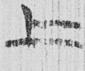上
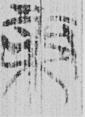帝
